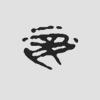妾
